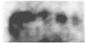一
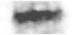一
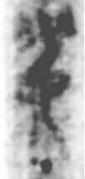貧（紛）
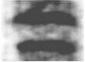二
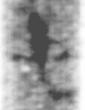屯
